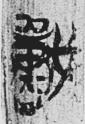○（戰）
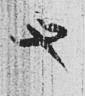又（有）
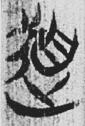道
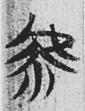{虍介}（乎）
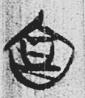合
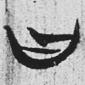曰
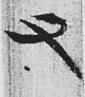又
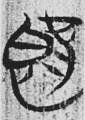既
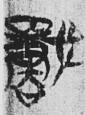○（戰）
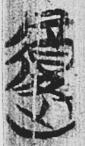○（復）
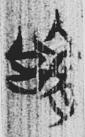豫
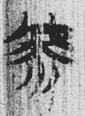{虍介}（號）
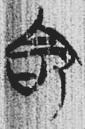命（令）
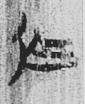於
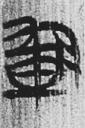軍
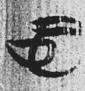𠁩
